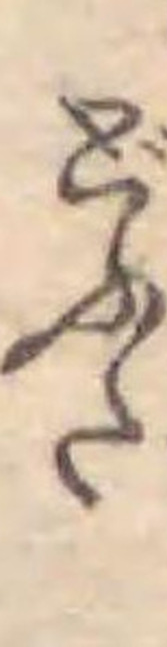どふた
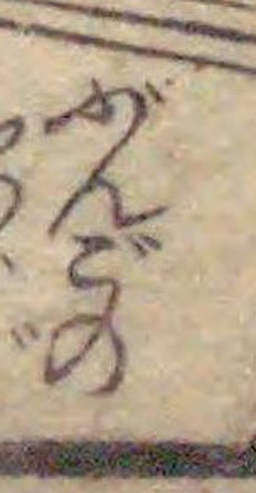ぶんごの
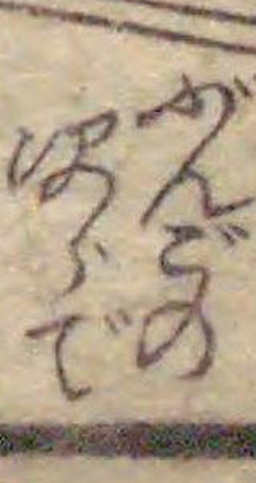次郎で
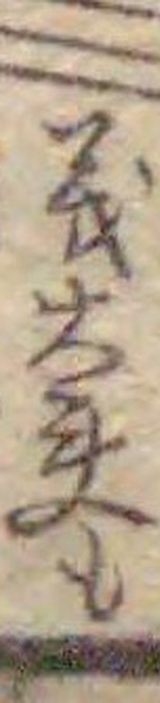義太夫も
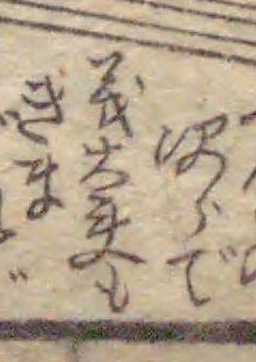義太夫も
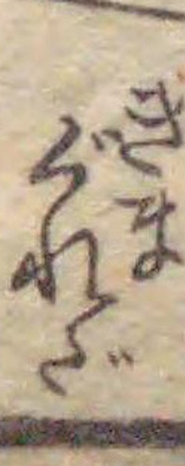ぐれだ
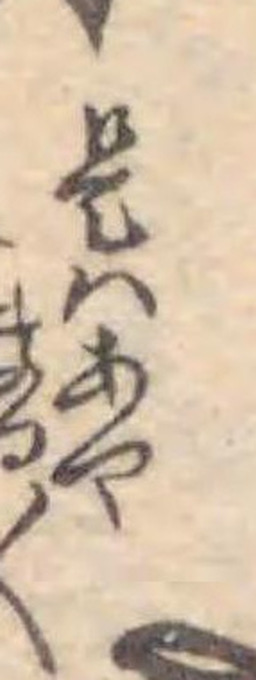是はあや
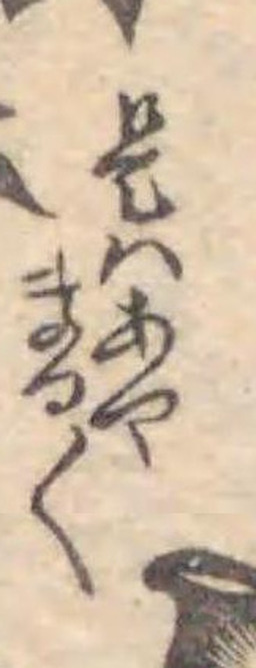まる〳〵
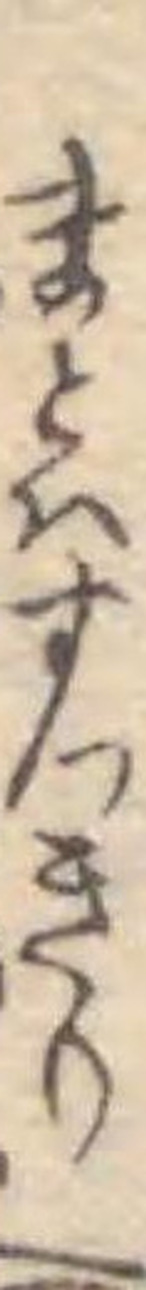まとはすつきり
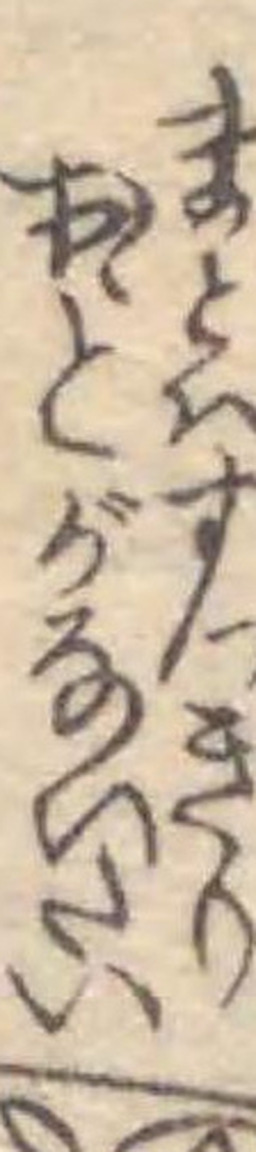おことがないたい
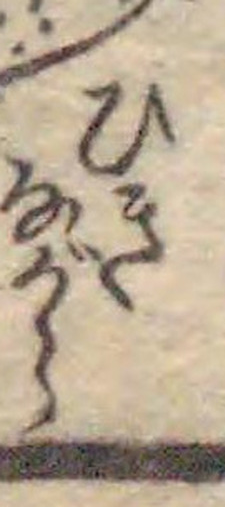ながら
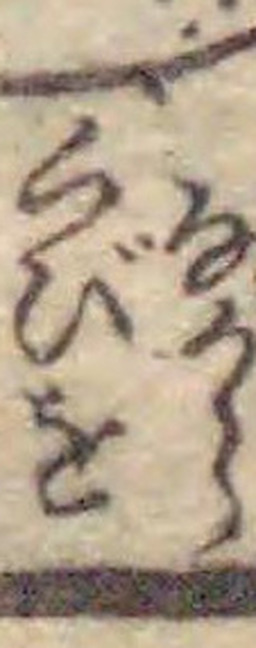くびを
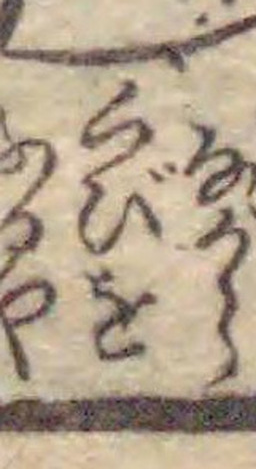ふるや
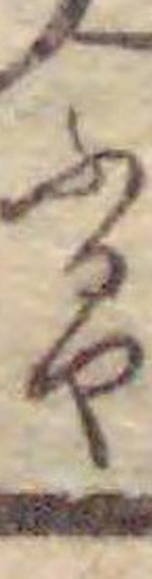ふるや
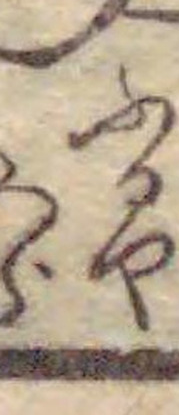ふるや
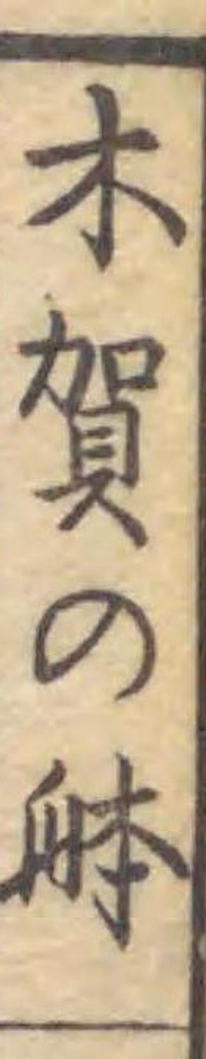木賀の体
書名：文武二道万石通 : 3巻
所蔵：国立国会図書館 National Diet Library, JAPAN
